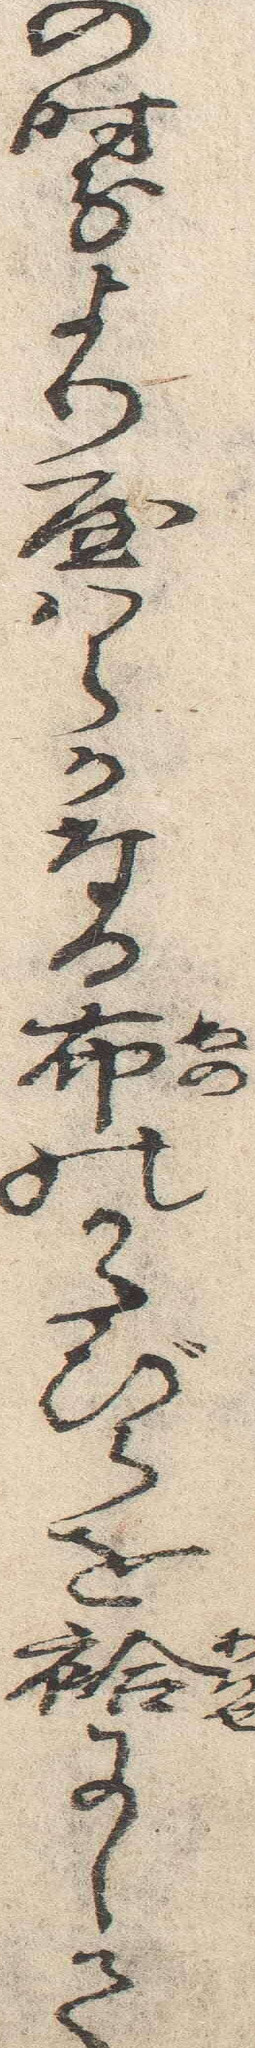の時分よりやはらかなる布のかたびらを袷にして
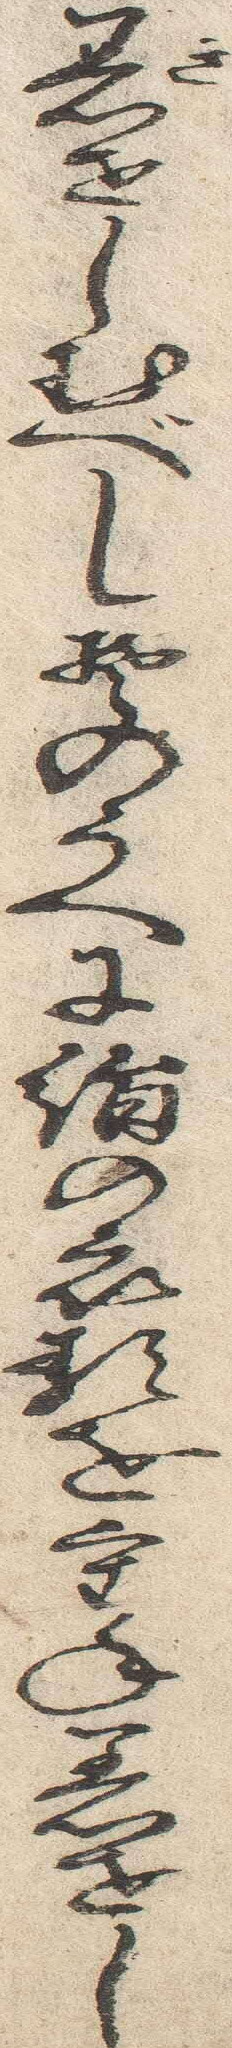着せしむべしそのうへに絹の衣類を重ね着せし
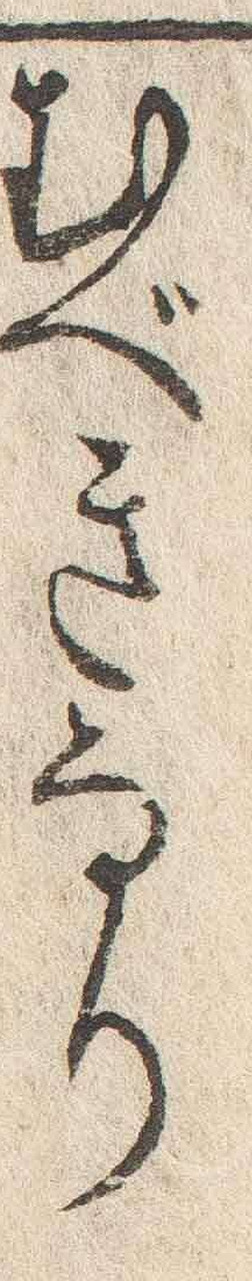むべきなり
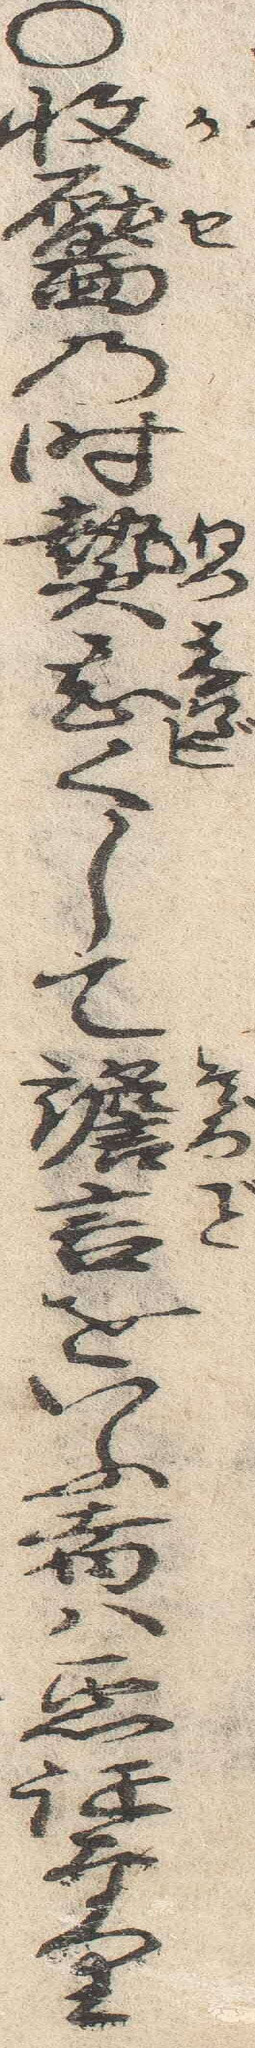○収靨の時熱甚くして譫言をいふ者は悪証なり
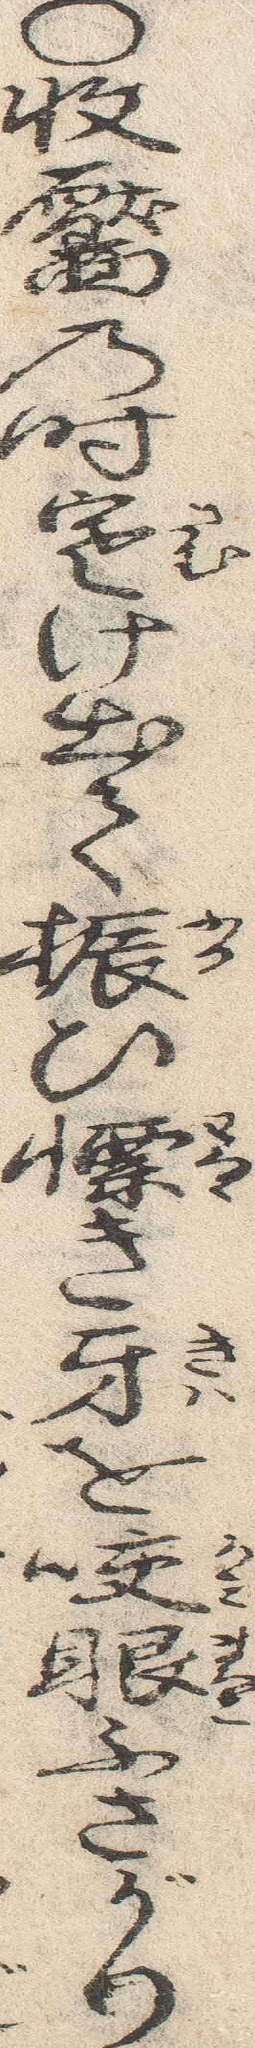○収靨の時寒け出て振ひ慄き牙を咬眼ふさがり
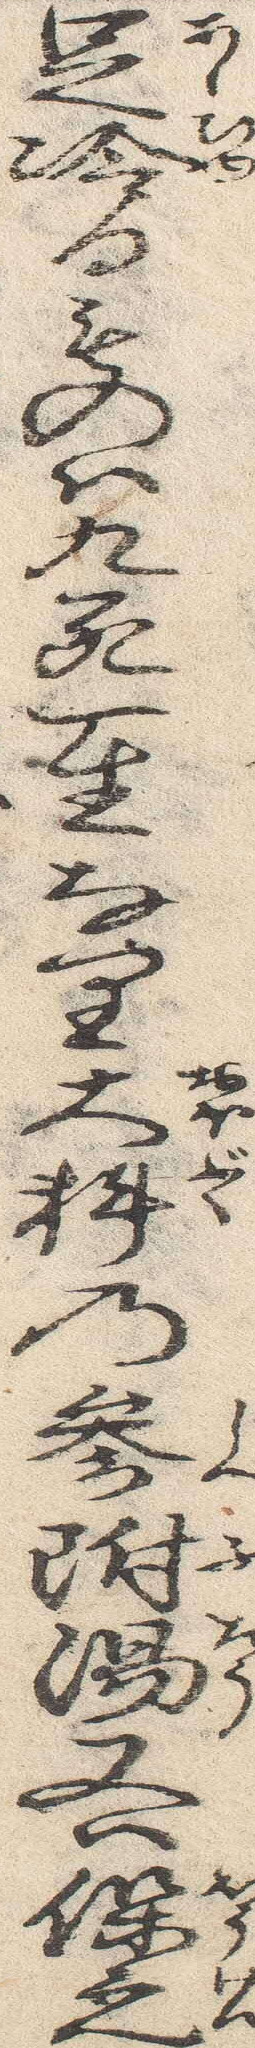足冷るものは九死一生なり大料の参附湯又は保元
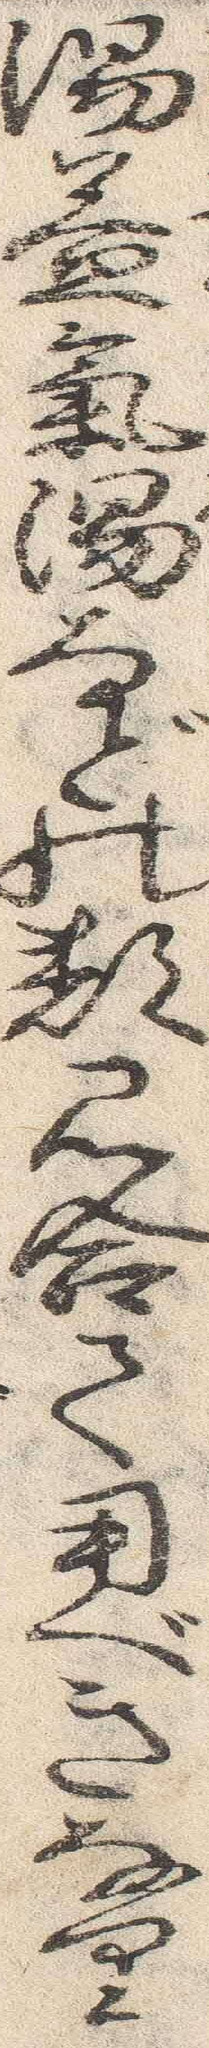湯益気湯などの類見合て用べきなり
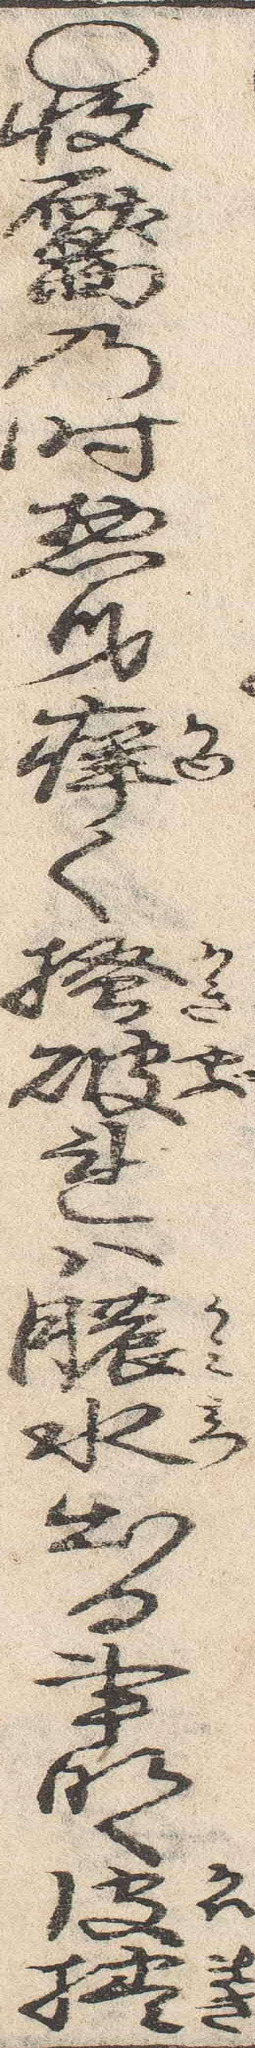○収靨の時総身痒く掻破れは膿水出る事なく皮捲
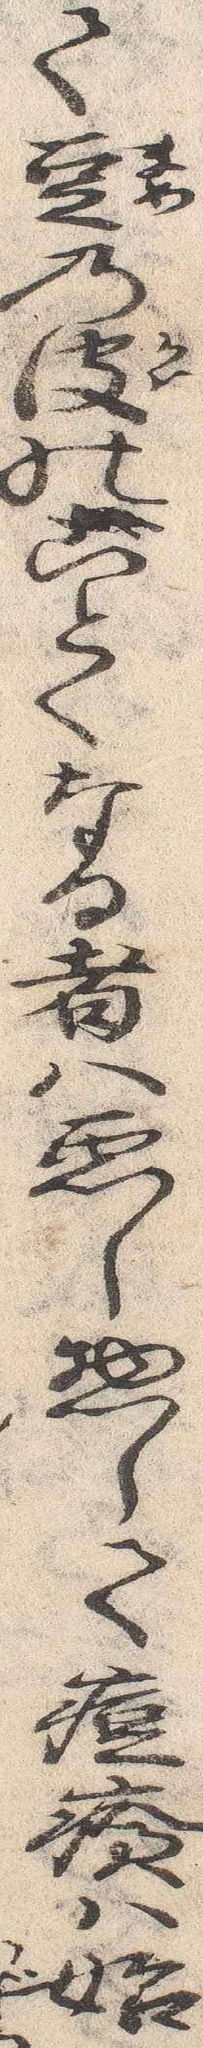て豆の皮のごとくなる者は悪し総して痘瘡は始
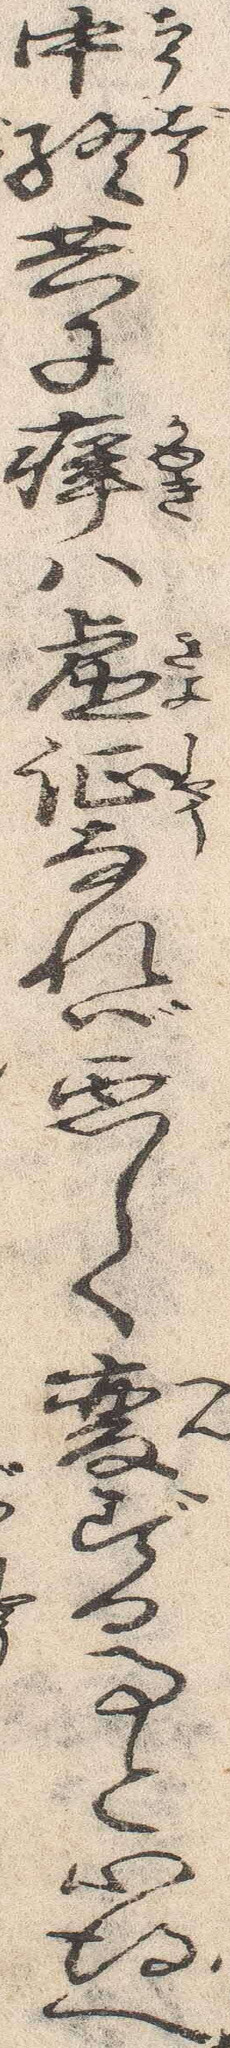中終共に痒は虚証なれば悪しく変ずる事と心得へ
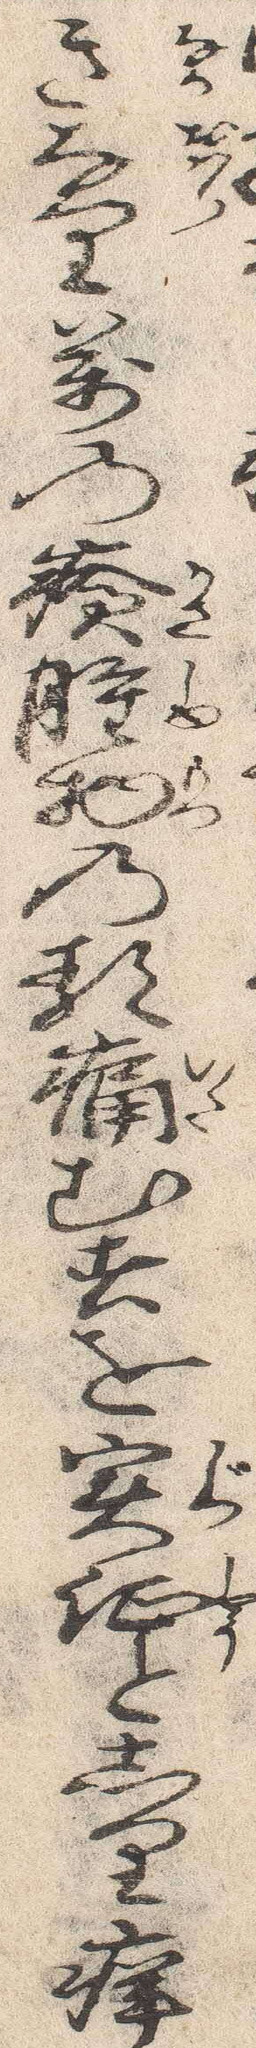きなり万の瘡腫物の類痛む者を実証としり痒
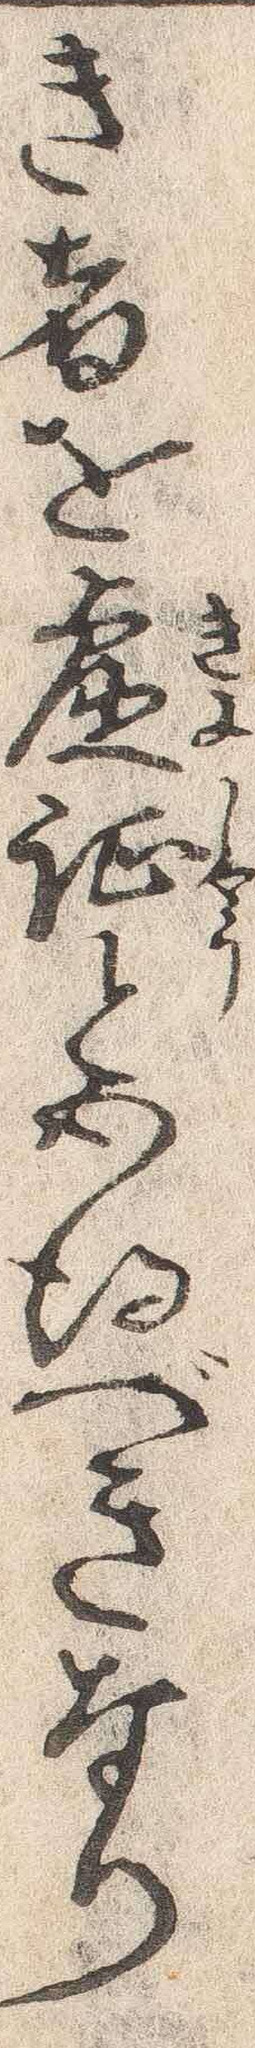き者を虚証と心得べきなり
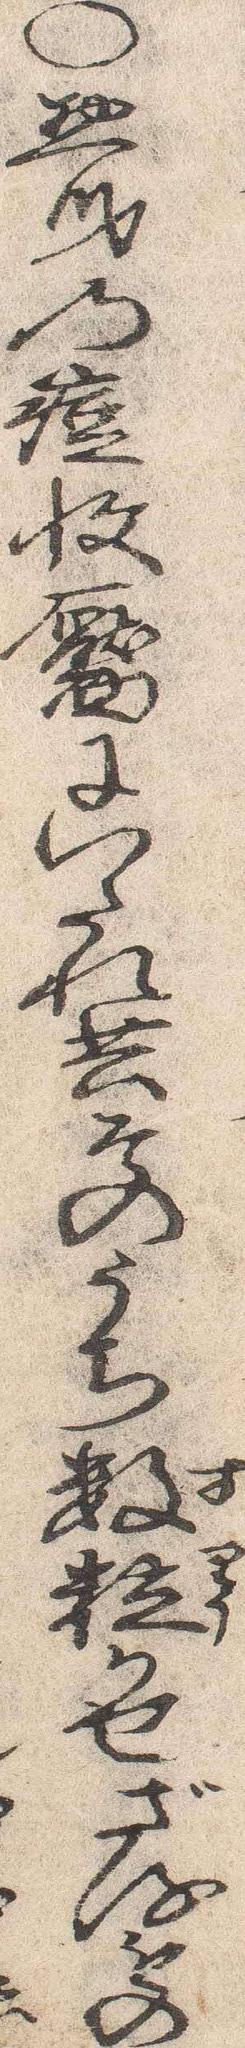○総身の痘収靨にいたれ共そのうち数粒かせざるもの
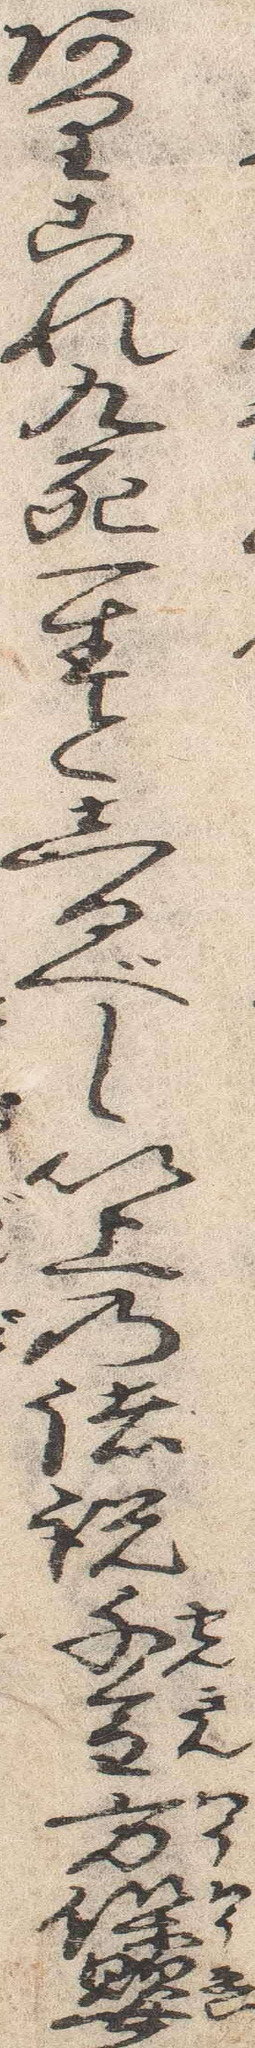ありこれ九死一生としるべし以上の諸説千金方保嬰
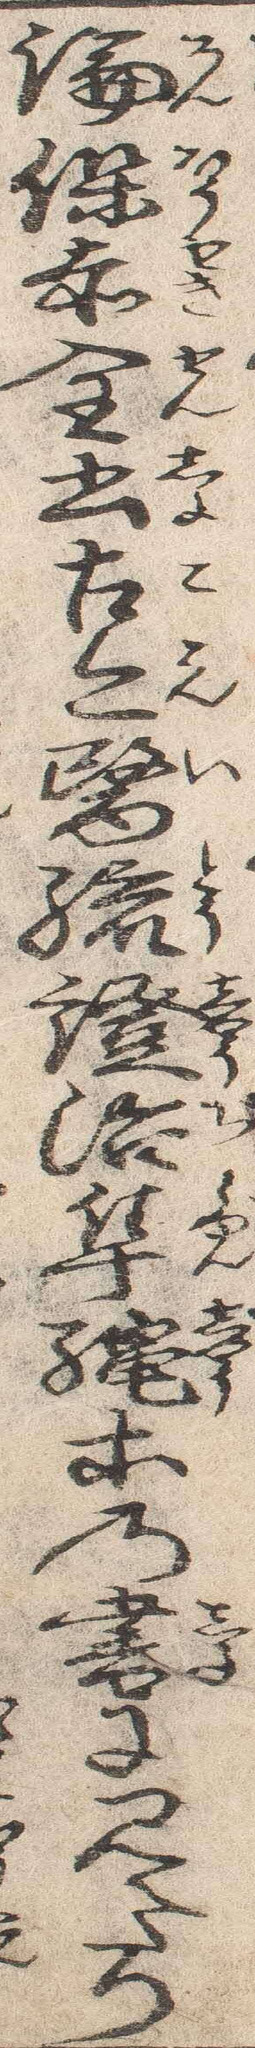論保赤全書古今医統証治準縄等の書に見えたり
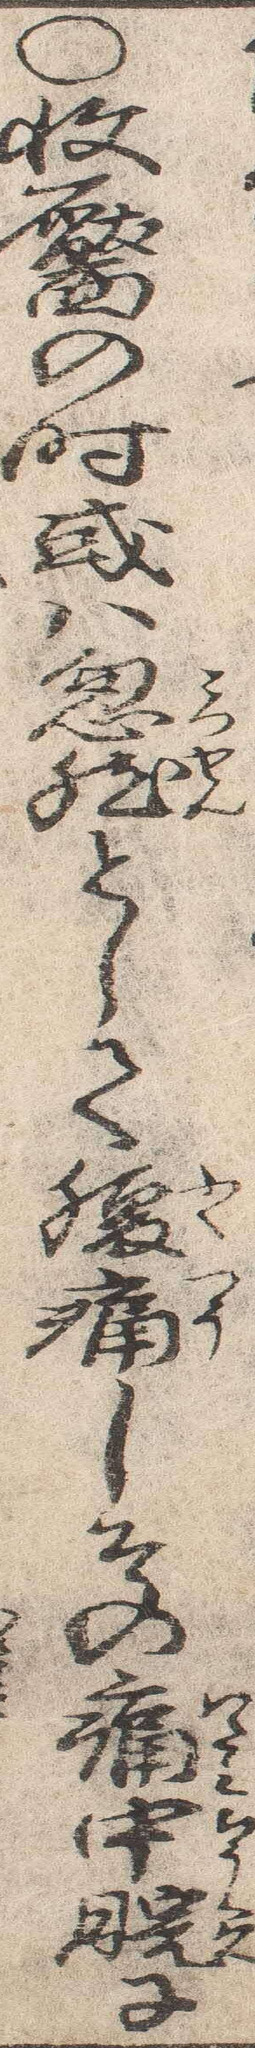○収靨の時或は忽然として腹痛しその痛中脘に
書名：小児必用養育草
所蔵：東京学芸大学附属図書館 国文学研究資料館
